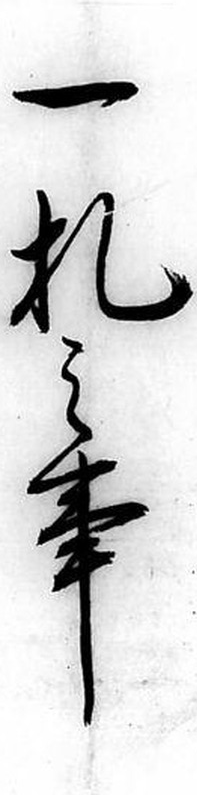一札之事
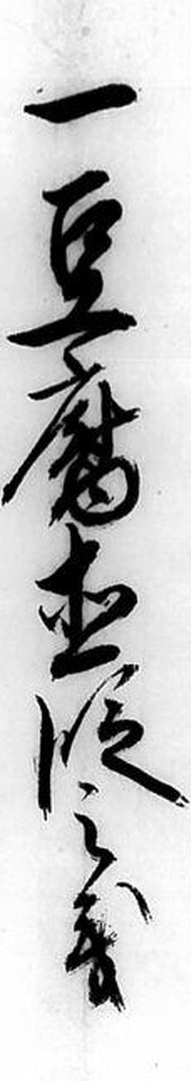一豆腐直段之義
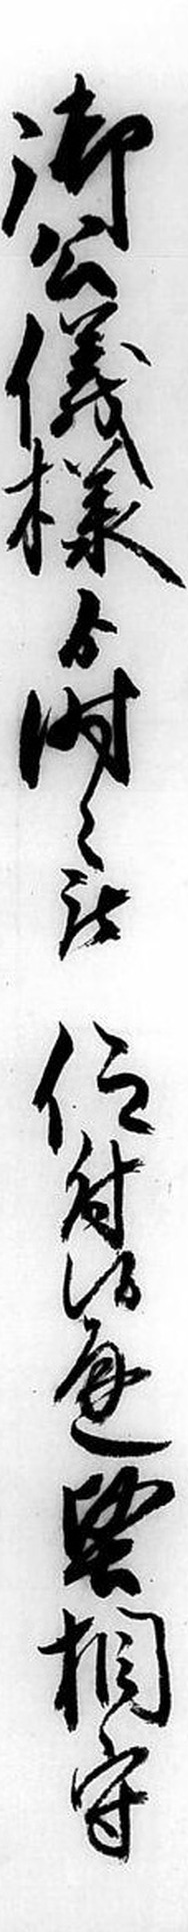御公儀様ゟ時々被仰付候通堅相守
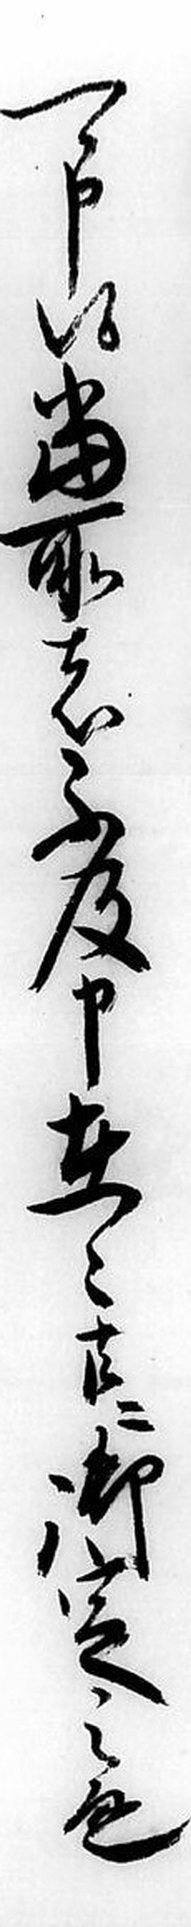可申候当所者不及申在々共ニ御定之通
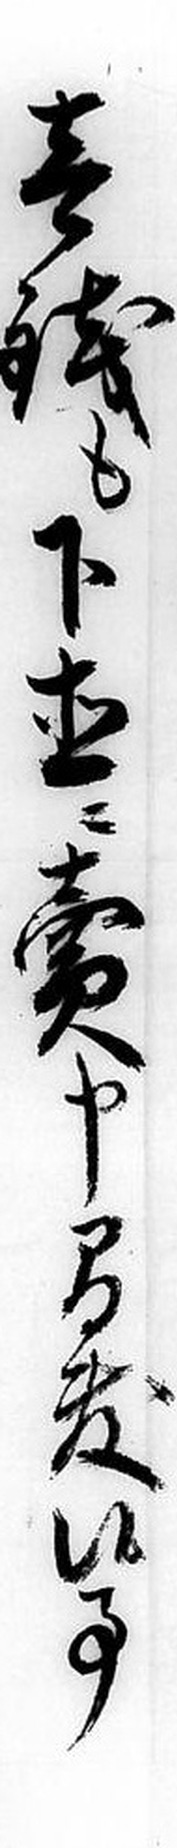壱銭も下直ニ売申間敷候事
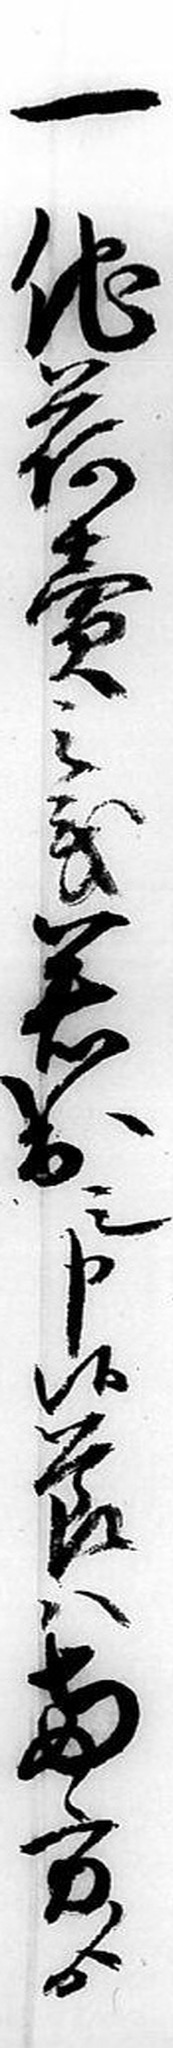一他荷売之義若出シ申候節ハ両方ゟ
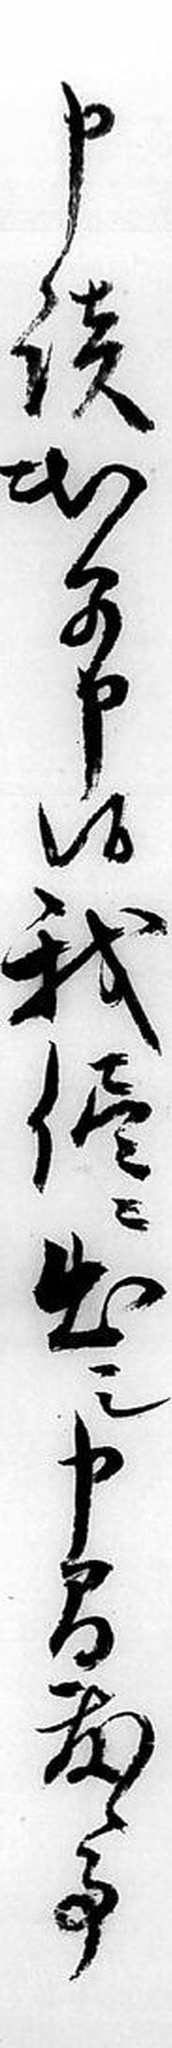申談出可申候我侭ニ出シ申間敷候事
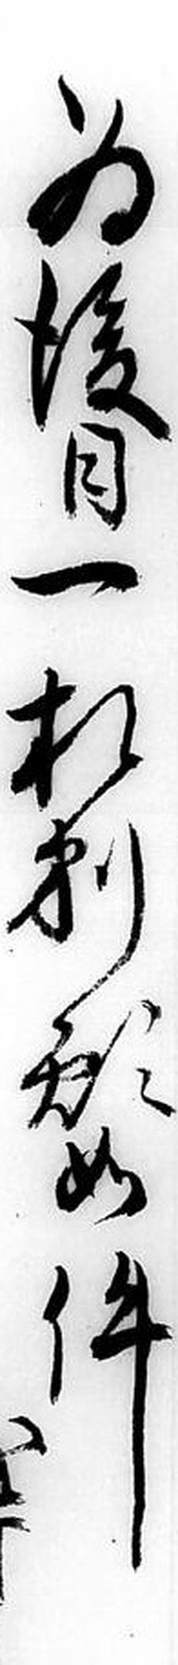為後目一札判形如件
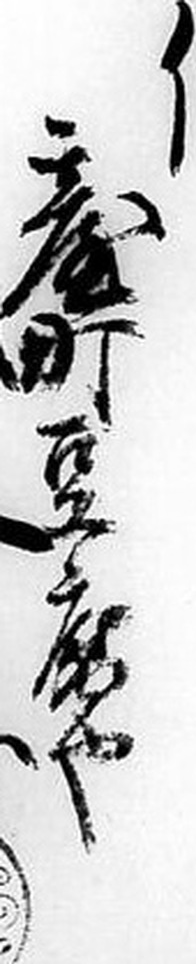台町豆腐や
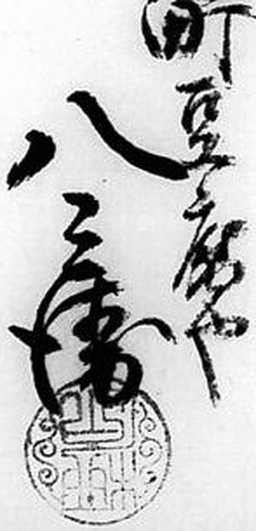八兵衛
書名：一札之事（豆腐直段ニ付）
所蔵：福井県文書館 Fukui Prefectural Archives
